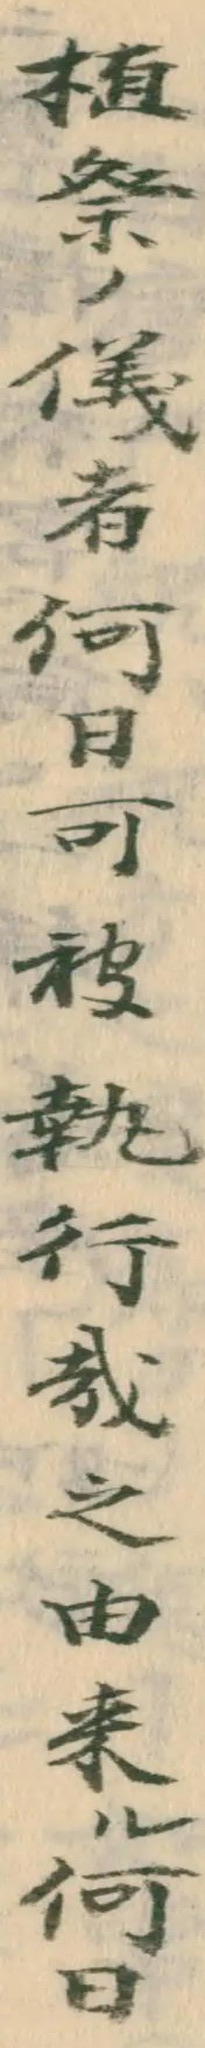植祭ノ儀者何日可被執行哉之由来ル何日
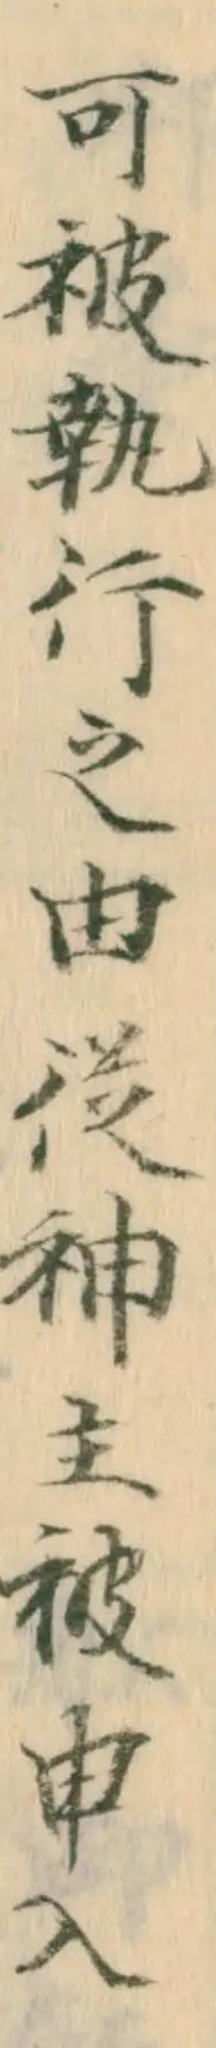可被執行之由従神主被申入
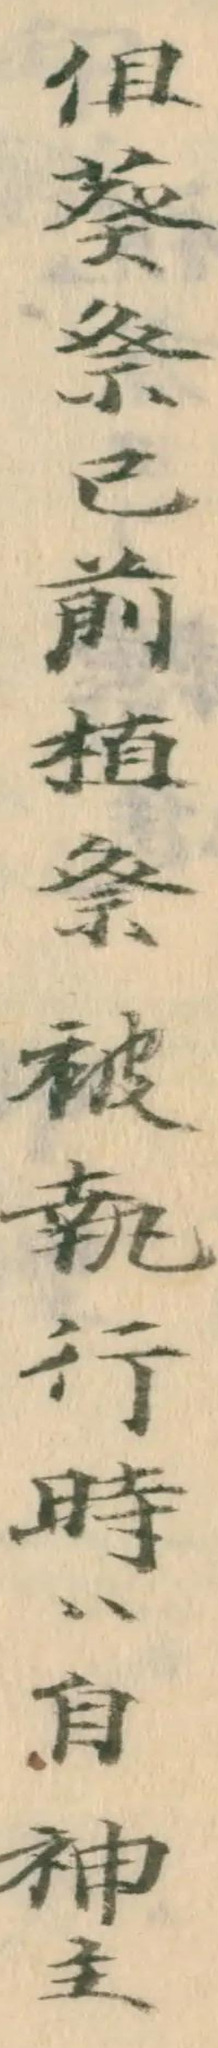但葵祭已前植祭被執行時ハ自神主
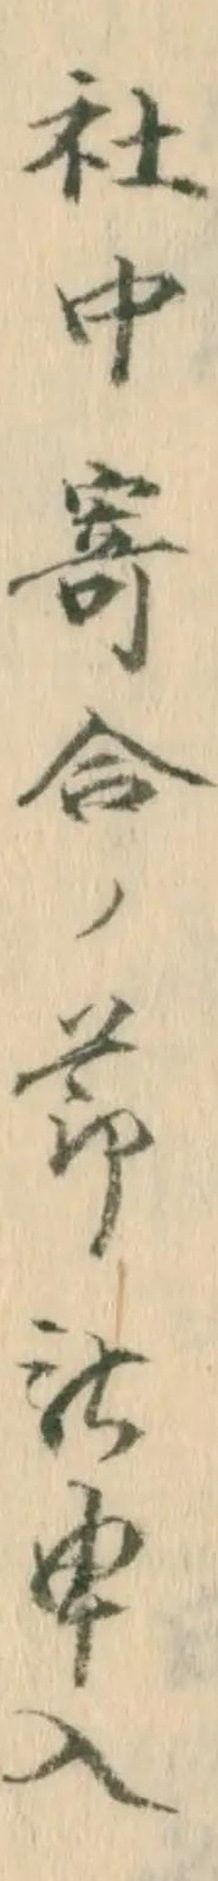社中寄合ノ節被申入
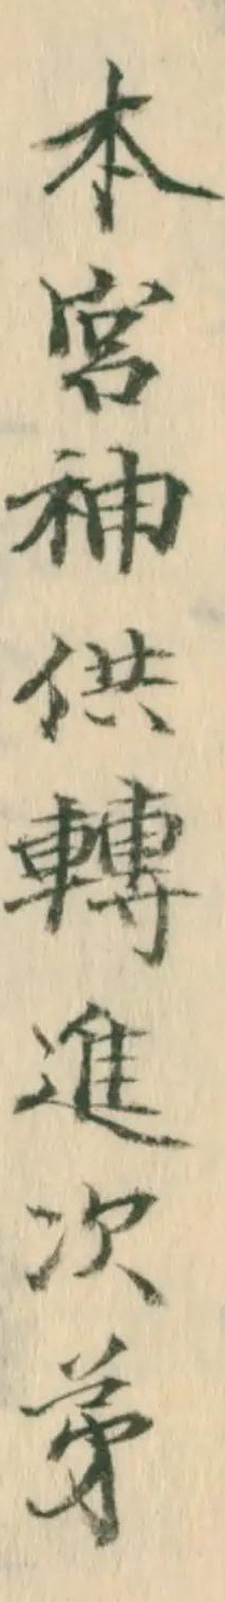本宮神供転進次第

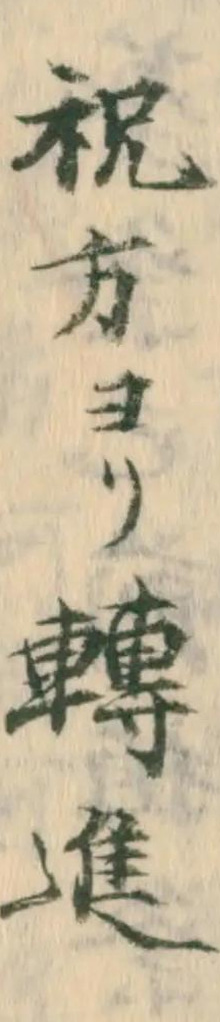祝方ヨリ転進
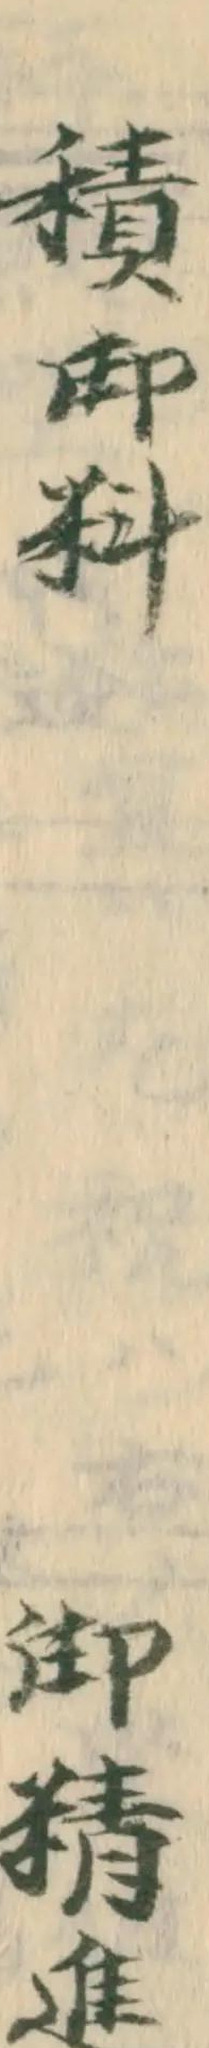積御料御精進
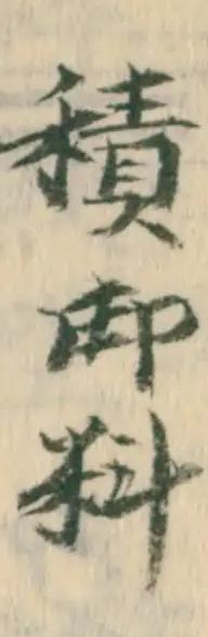駒御料
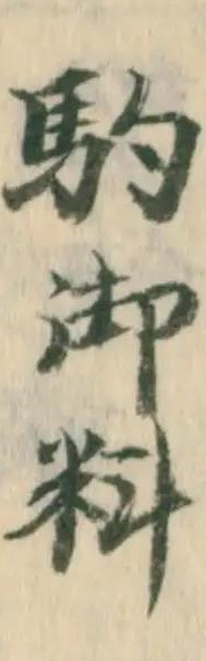駒御料
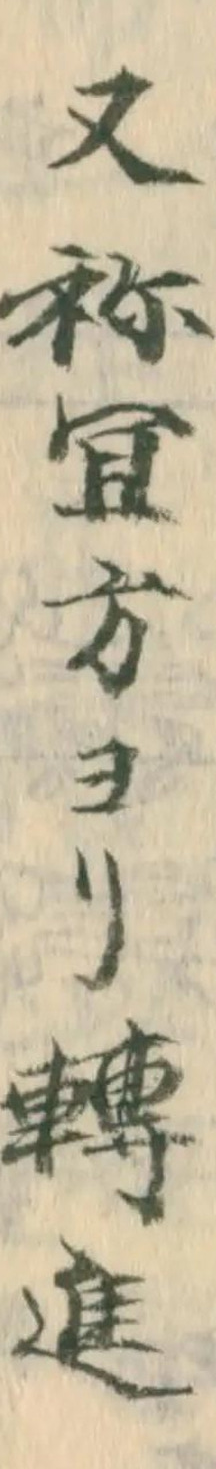又禰宜方ヨリ転進

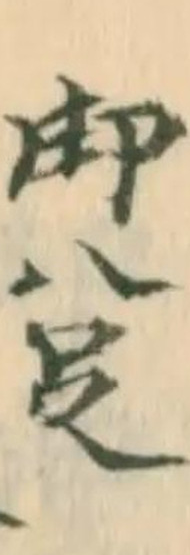御八足
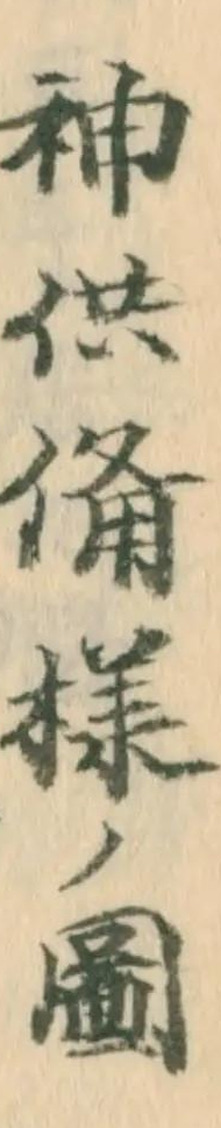神供備様ノ図
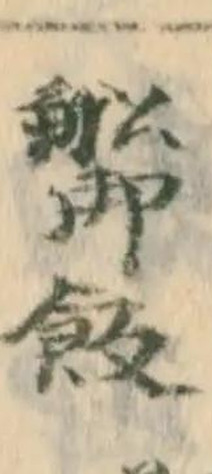船御飯
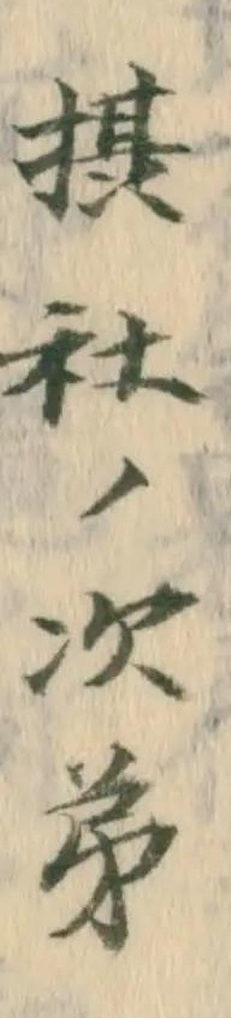摂社ノ次第
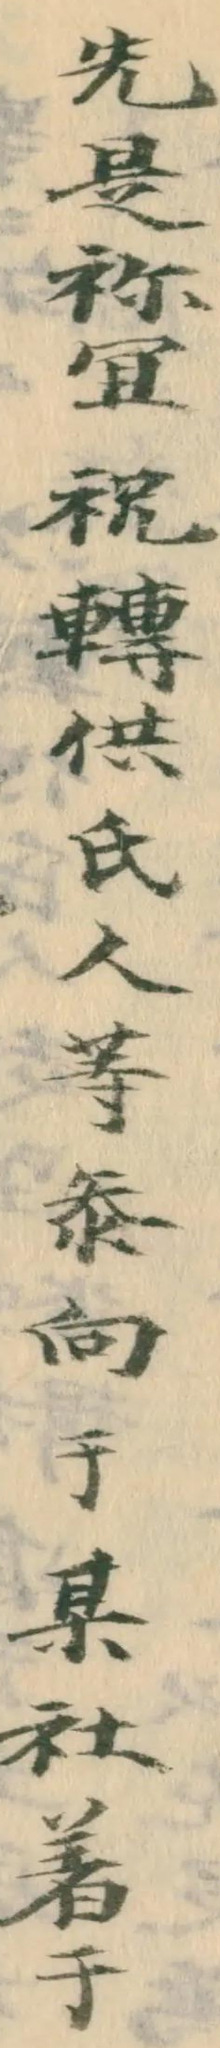先是禰宜祝転供氏人等参向于某社着于
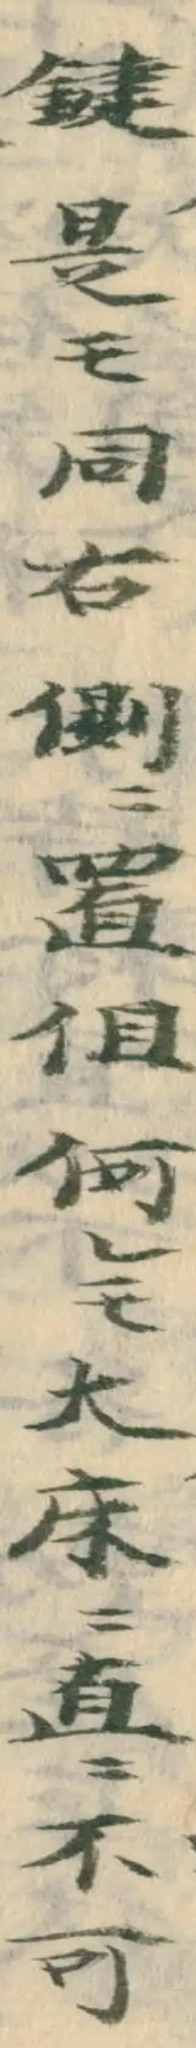鍵是モ同右側ニ置但何レモ大床二直二不可置
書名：賀茂社記録. 第5冊
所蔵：国立国会図書館 National Diet Library, JAPAN
